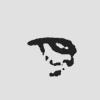月
